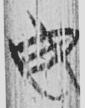母
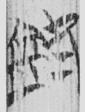欽
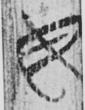母
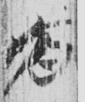去
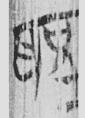聖（聲）
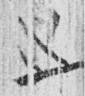之
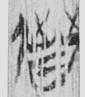○（疾）
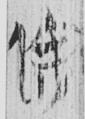○（徐）
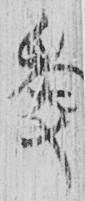○（稱）
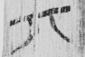亓（其）
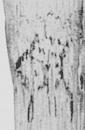眾
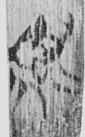○（寡）
